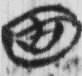固
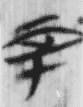辛
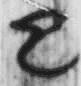巳
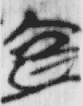宣
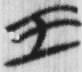王
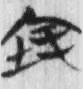○（坉）
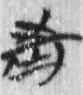市
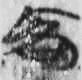客
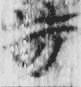苛
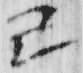己
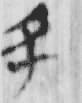丑
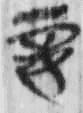妾
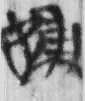婦
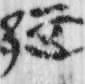正
